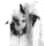丙
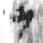丁
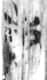庚
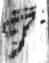辛
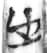甲
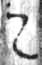乙
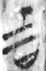吉
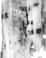壬
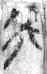癸
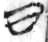日
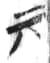亓（其）
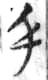身
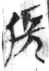倀（長）
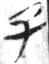子
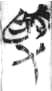受
